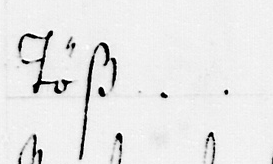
Töß
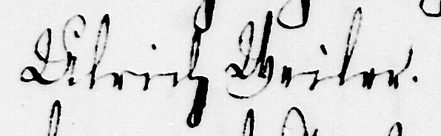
Ulrich Weiler.
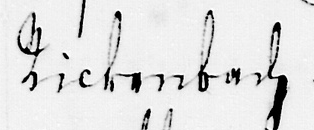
Rickenbach.
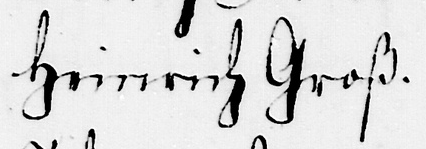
Heinrich Groß.
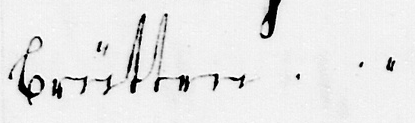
Brütten
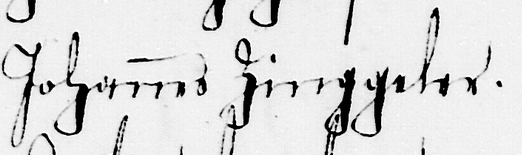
Johannes Zinggeler.
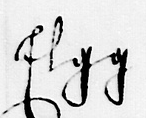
Elgg
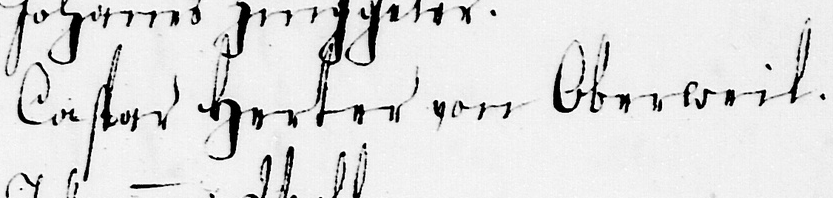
Caspar Herter von Oberweil.
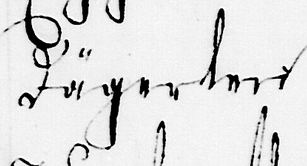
Dägerlen
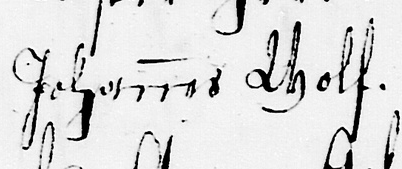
Johannes Wolf.
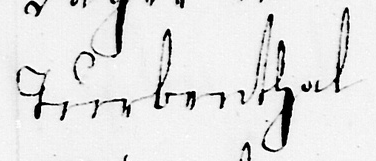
Turbenthal
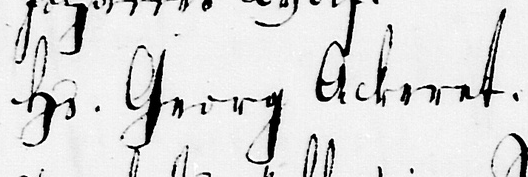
Hs. Georg Ackeret.
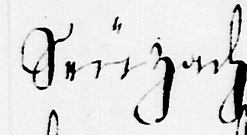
Seuzach.
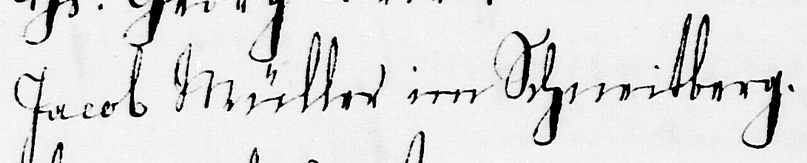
Jacob Müller im Schneitberg.
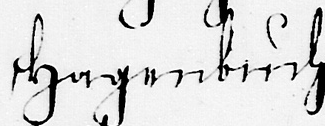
Hagenbuch.
